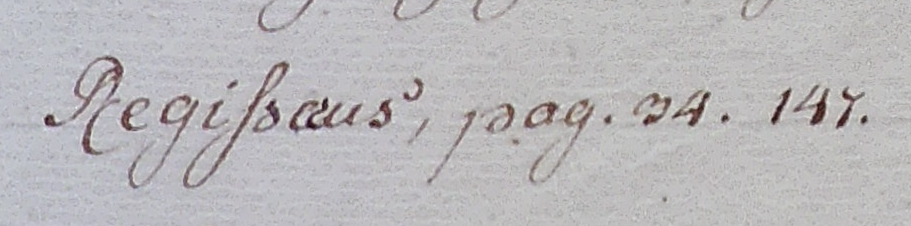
Regisserus, pag. 34. 147.
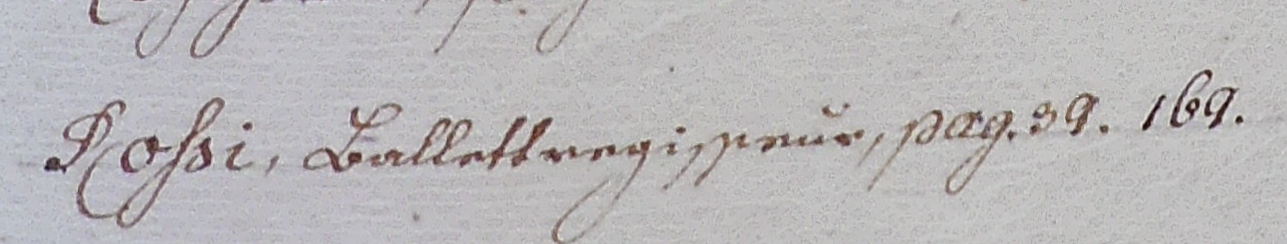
Rossi, Ballettregisseur, pag. 39. 169.
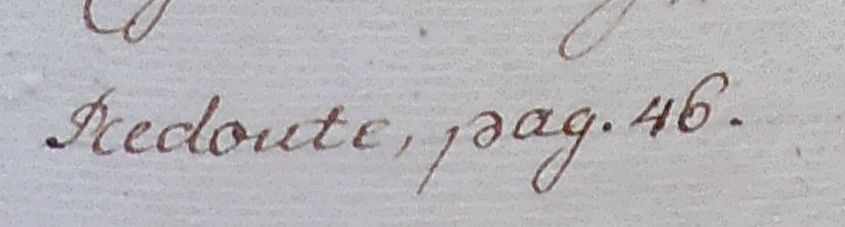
Redoute, pag. 46.
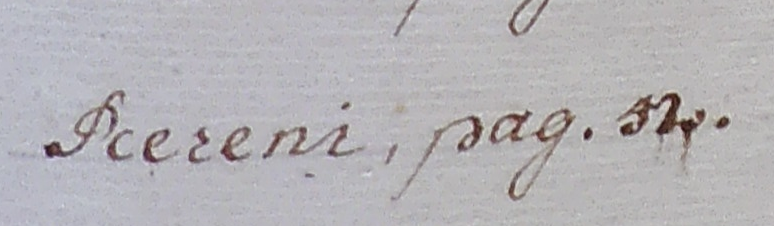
Rereni, pag. 52.
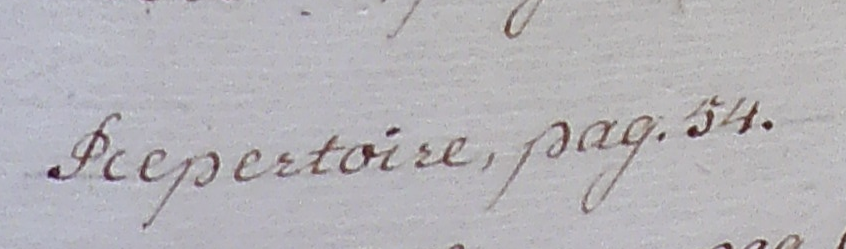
Repertoire, pag. 54.
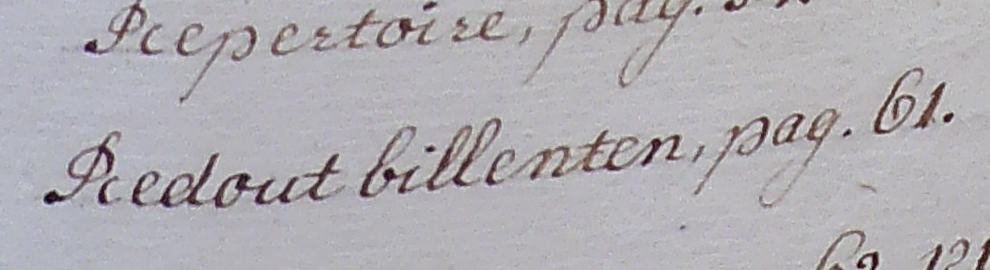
Redout billenten, pag. 61.
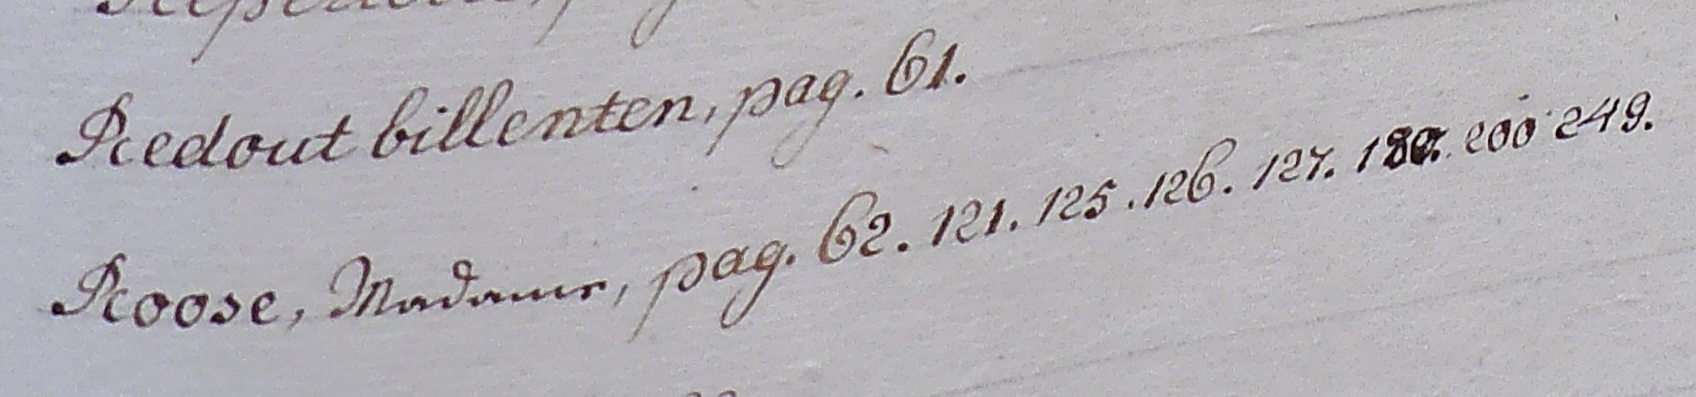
Roose, Madame, pag. 62. 121. 125. 126. 127. 180. 200. 249.
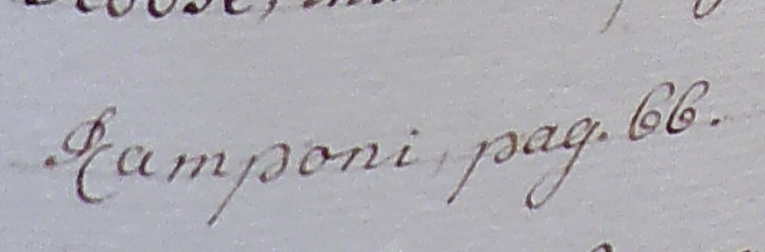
Ramponi, pag. 66.
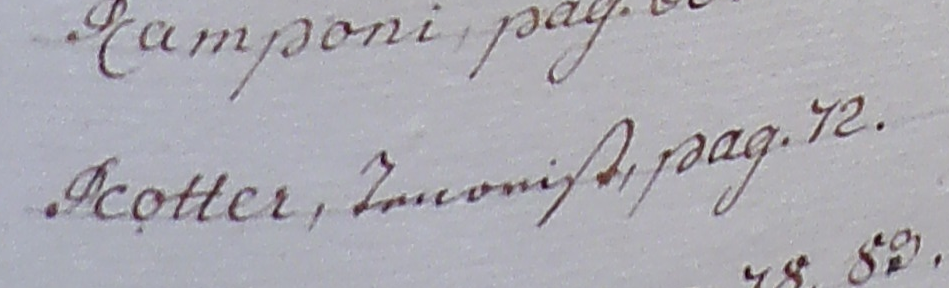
Rotter, Tenorist, pag. 72.
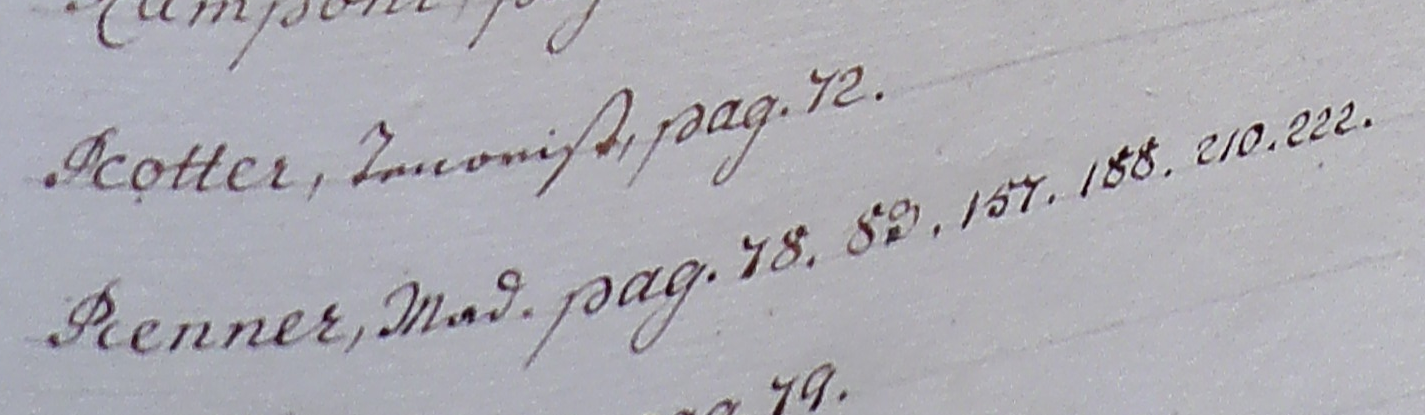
Renner, Mad. pag. 78. 83. 157. 188. 210. 222.
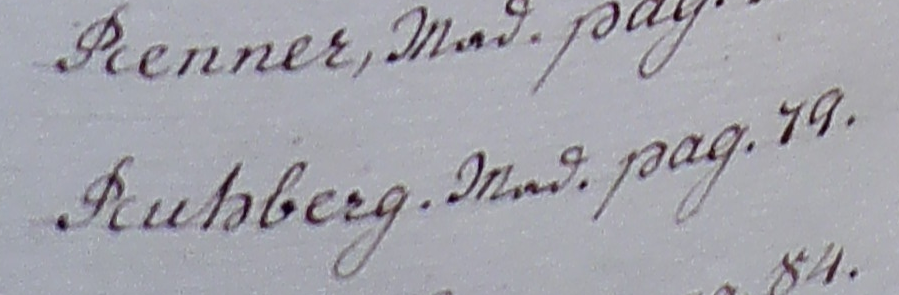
Ruhberg, Mad. pag. 79.
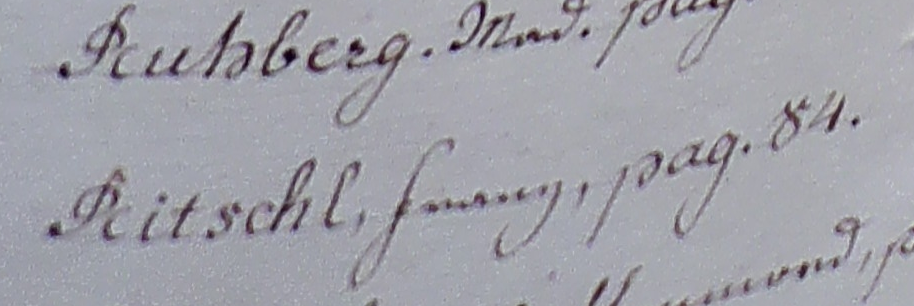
Ritschl, Franz, pag. 84.
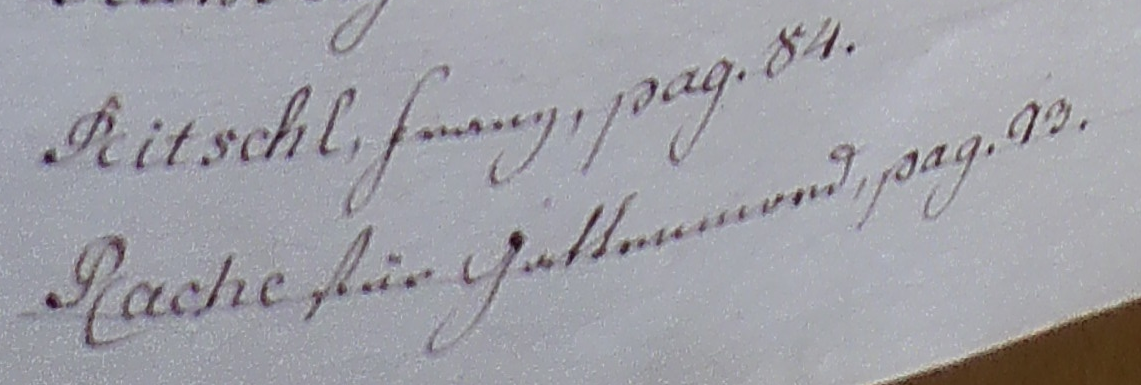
Rache für Gattenmord, pag. 93.
